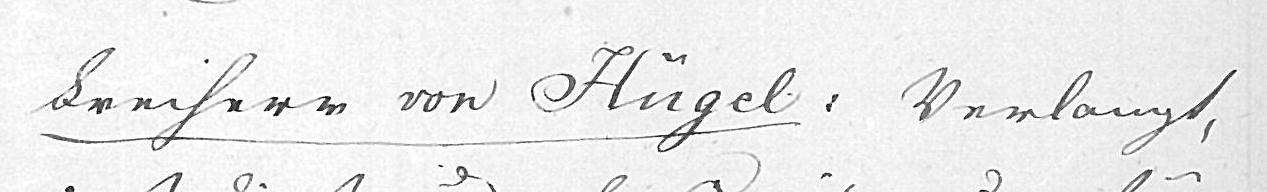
Freiherr von Hügel: Verlangt,
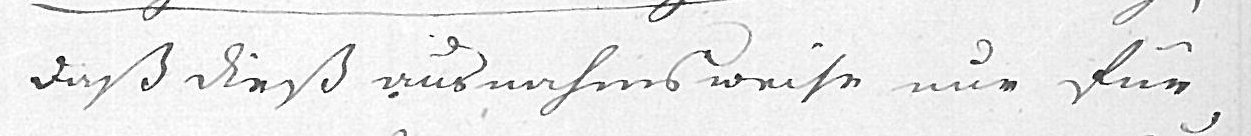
daß dieß ausnahmsweise nur für
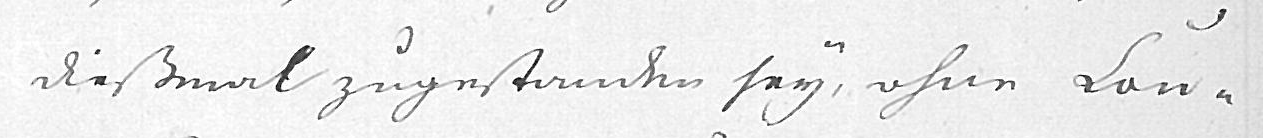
dießmal zugestanden seye, ohne Con-
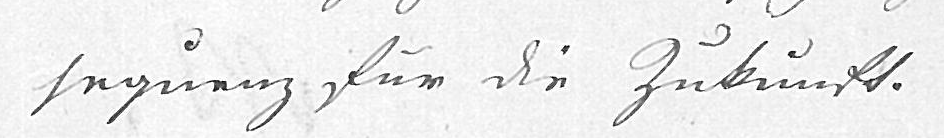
sequenz für die Zukunft.
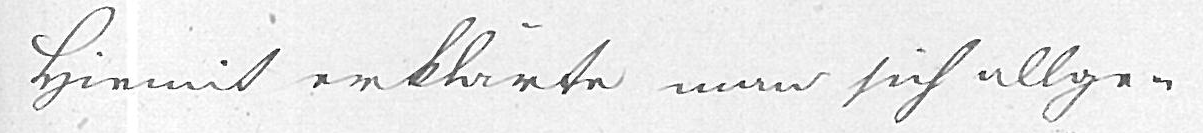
Hiermit erklärte man sich allge-
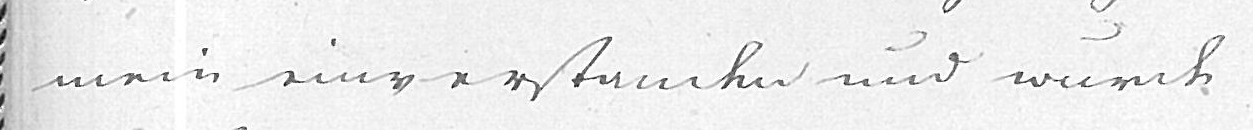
mein einverstanden und wurde
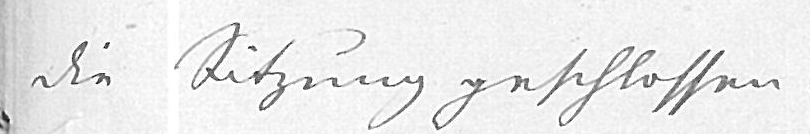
die Sitzung geschlossen.
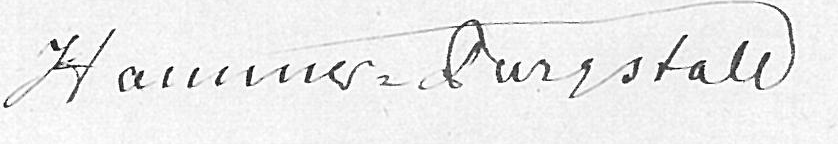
Hammer-Purgstall
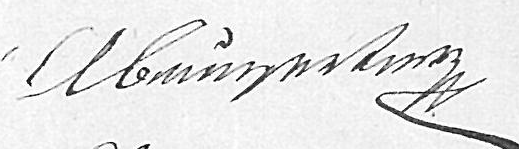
ABaumgartner
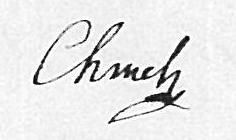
Chmel
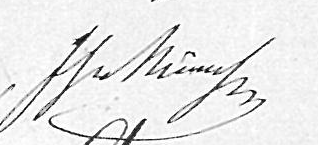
FhrMünch
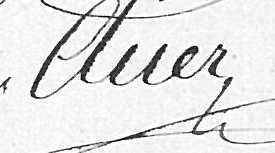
Auer
